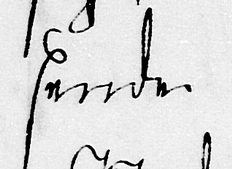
sende.
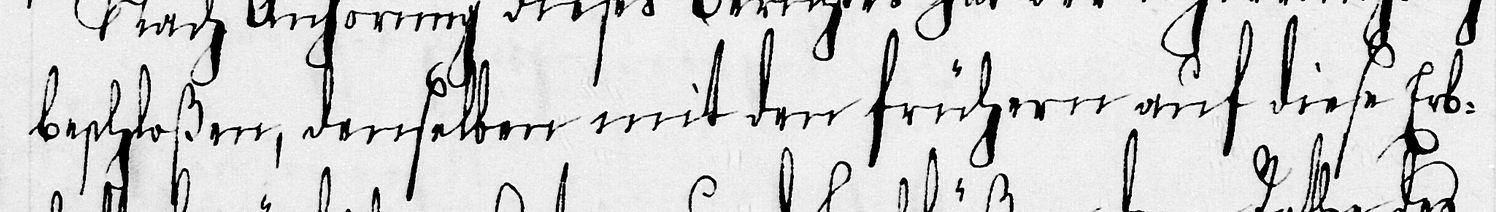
beschloßen, denselben mit den frühern auf diese Erbs¬
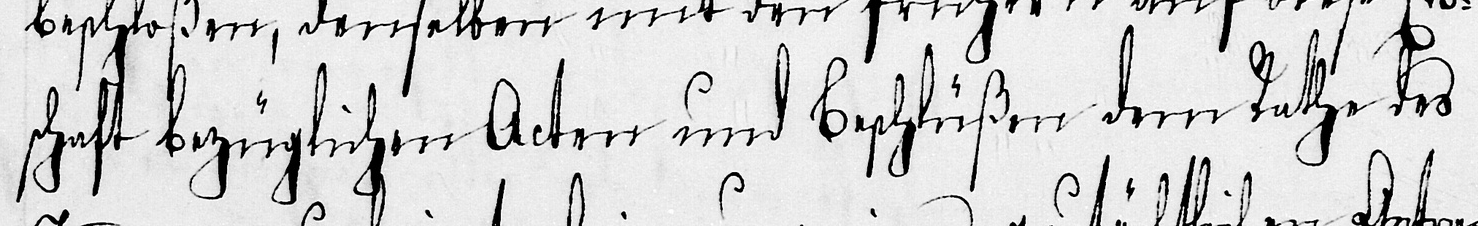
chaft bezüglichen Acten und Beschlüßen dem Rathe des
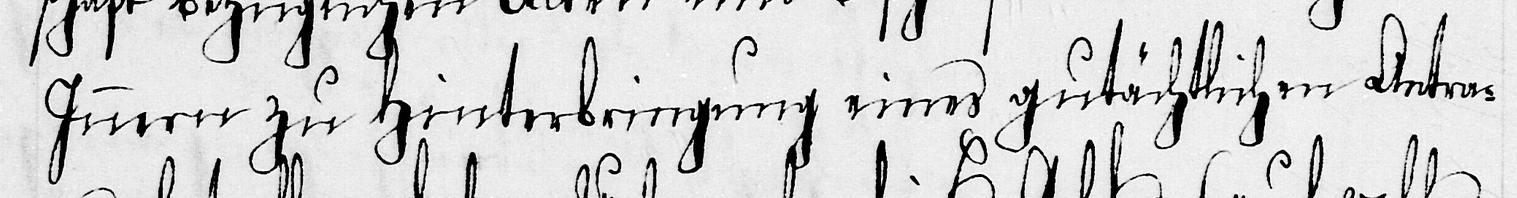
Innern zu Hinterbringung eines gutächtlichen Antra¬
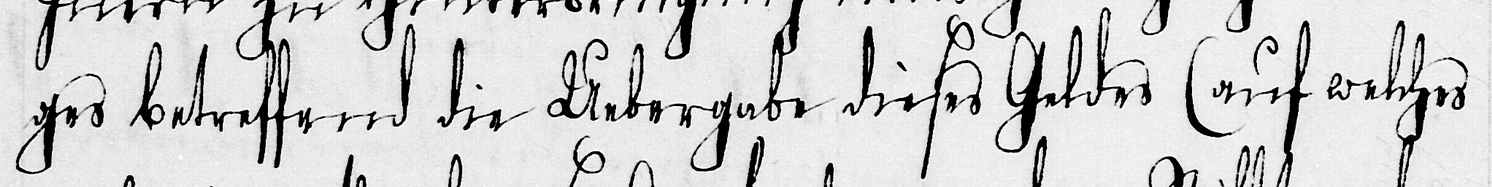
ges betreffend die Uebergabe dieses Geldes (auf welches
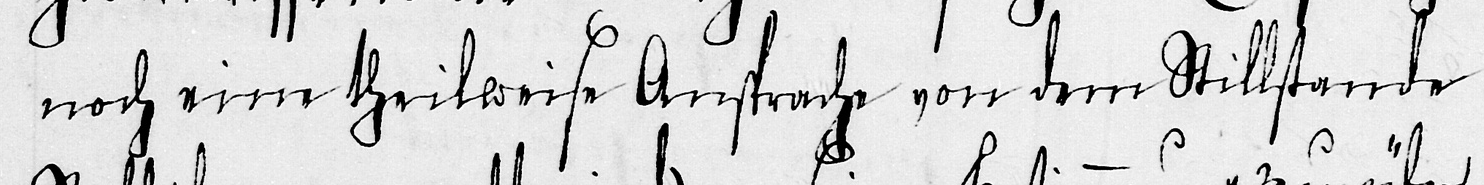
noch eine theilweise Ansprache von dem Stillstande
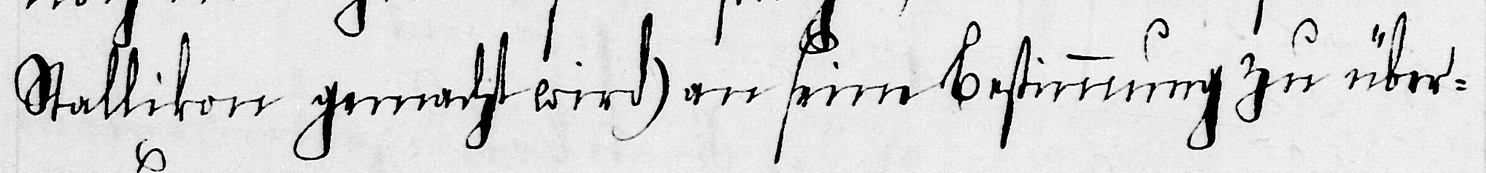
Stallikon gemacht wird) an seine Bestimmung zu über¬
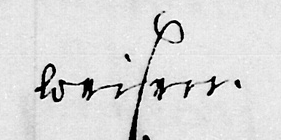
weisen.
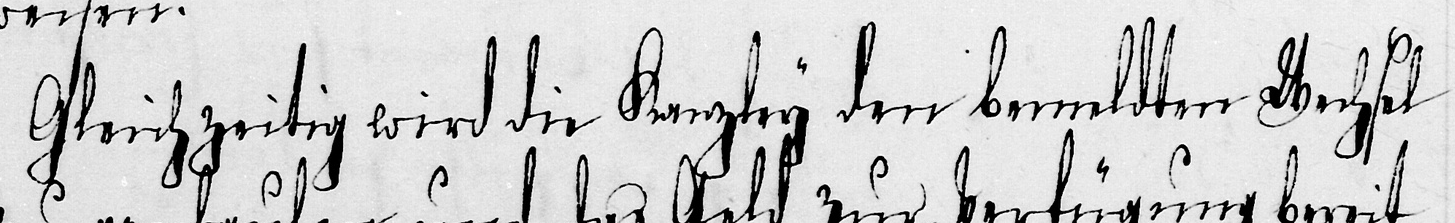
Gleichzeitig wird die Kanzley den bemeldten Wechsel
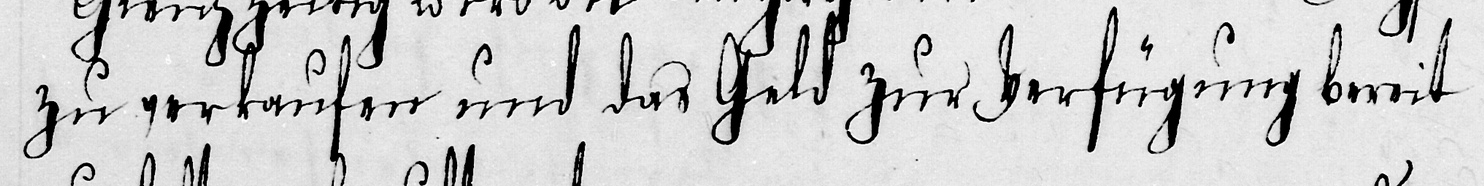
zu verkaufen und das Geld zur Verfügung bereit
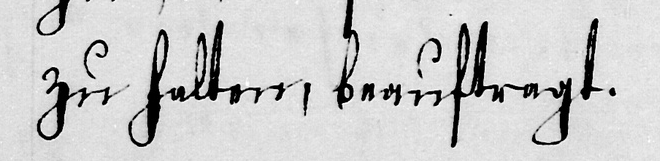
zu halten, beauftragt.
